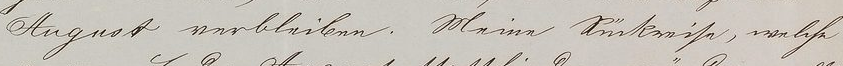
August verbleiben. Meine Rückreise, welche
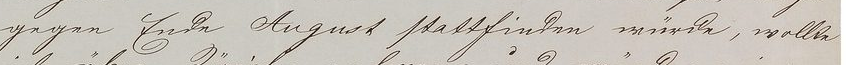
gegen Ende August stattfinden würde, wollte
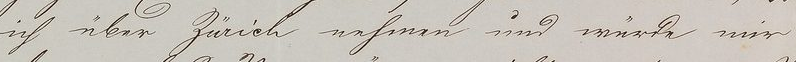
ich über Zürich nehmen und würde mir
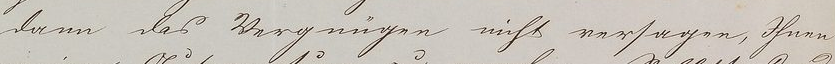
dann das Vergnügen nicht versagen, Ihnen
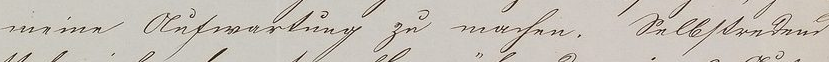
meine Aufwartung zu machen. Selbstredend
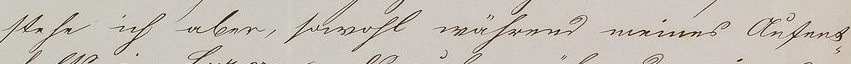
stehe ich aber, sowohl während meines Aufent-
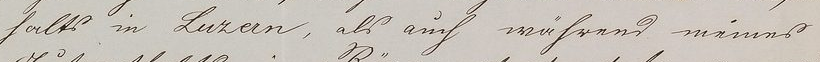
halts in Luzern, als auch während meines
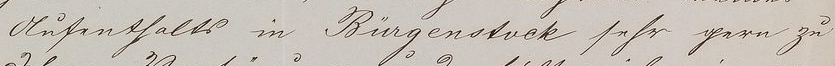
Aufenthalts in Bürgenstock sehr gern zu
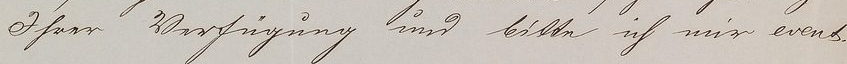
Ihrer Verfügung und bitte ich mir event.
